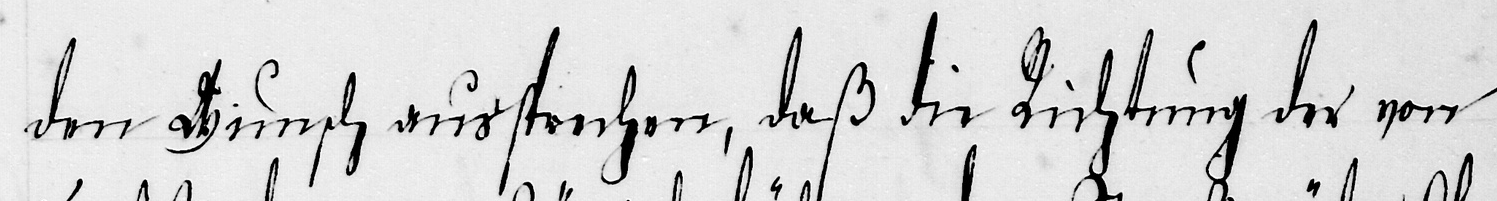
den Wunsch aussprechen, daß die Richtung der von
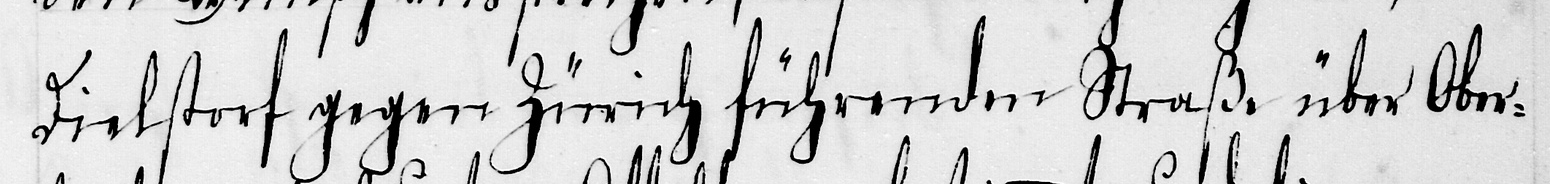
Dielstorf gegen Zürich führenden Straße über Ober¬
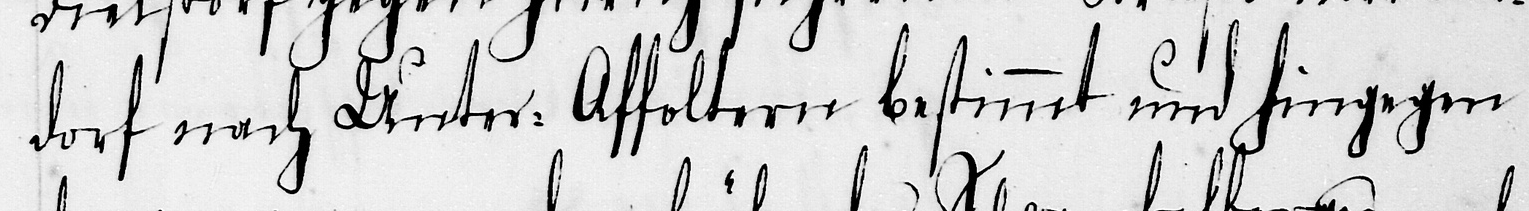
dorf nach Unter-Affoltern bestimmt und hingegen
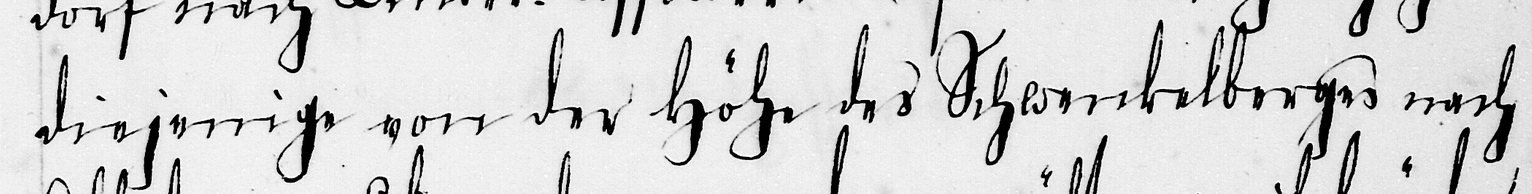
diejenige von der Höhe des Schwenkelberges nach
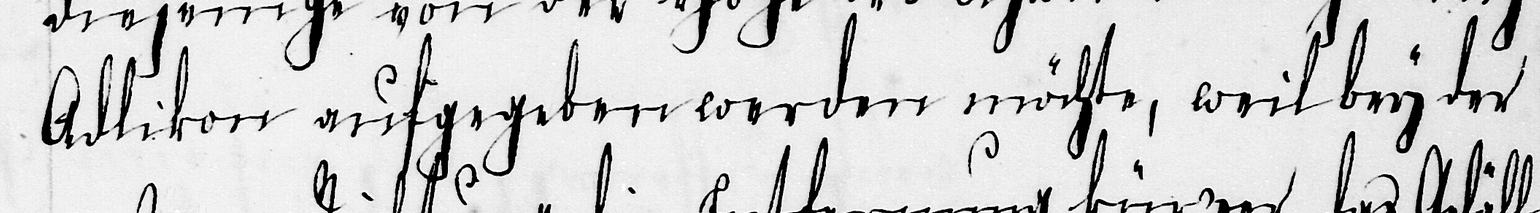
Adlikon aufgegeben werden möchte, weil bey der
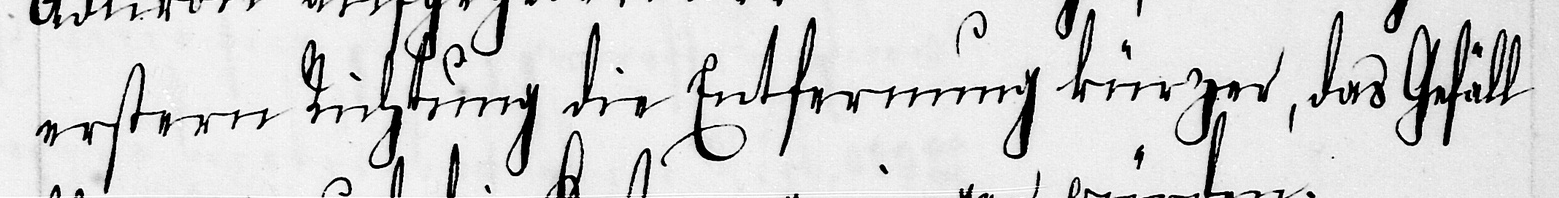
erstern Richtung die Entfernung kürzer, das Gefäll
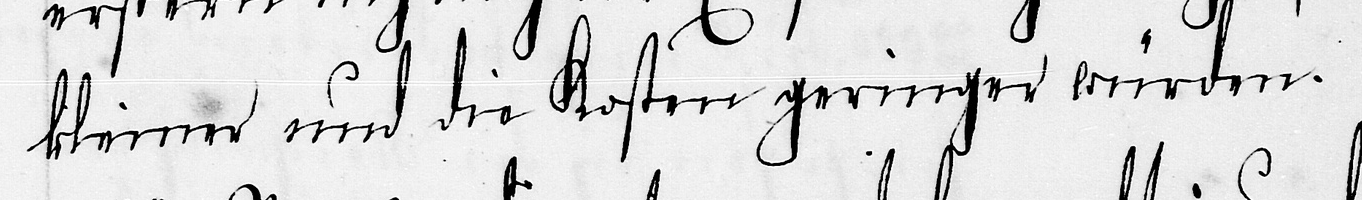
kleiner und die Kosten geringer würden.
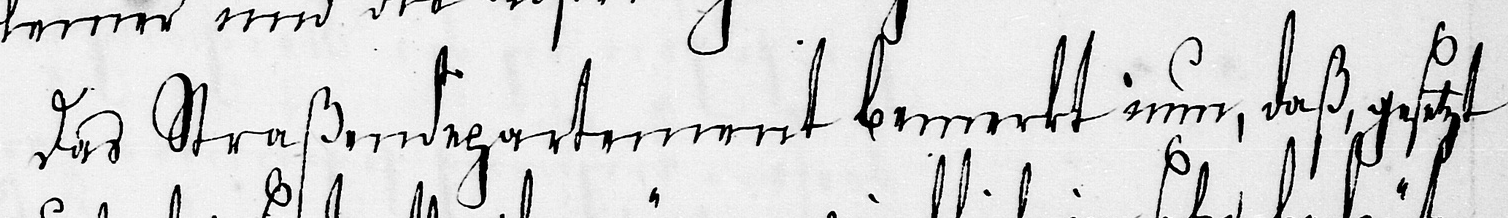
Das Straßendepartement bemerkt nun, daß, geset¬
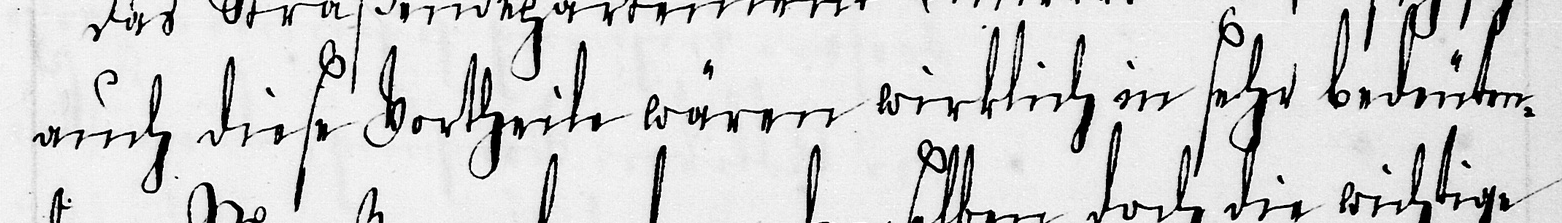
auch diese Vortheile wären wirklich in sehr bedeuten¬
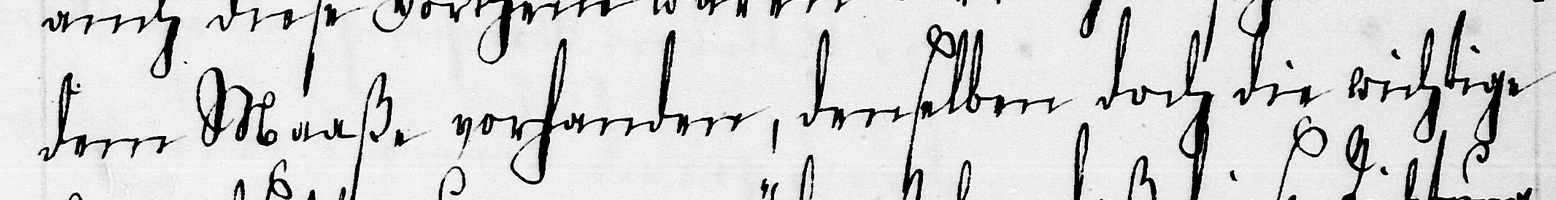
dem Maaße vorhanden, denselben doch die wichtige
